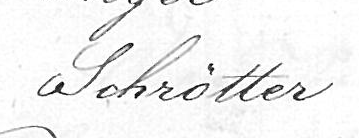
Schrötter
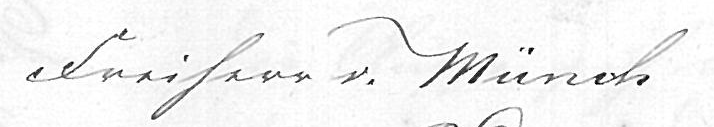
Freiherr v. Münch
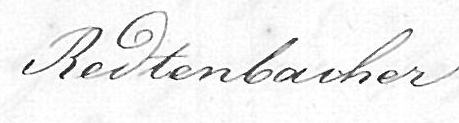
Redtenbacher
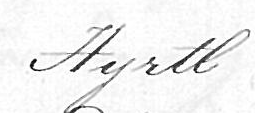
Hyrtl
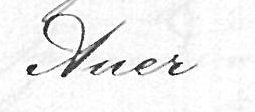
Auer
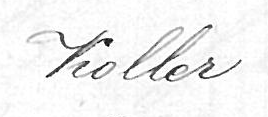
Koller
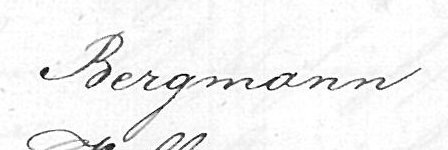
Bergmann
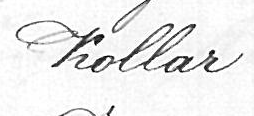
Kollar
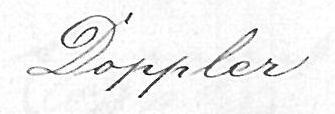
Doppler
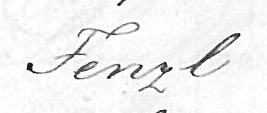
Fenzl
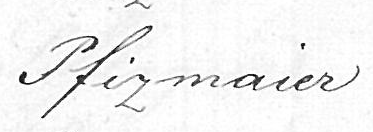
Pfizmaier
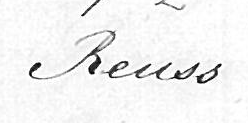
Reuss
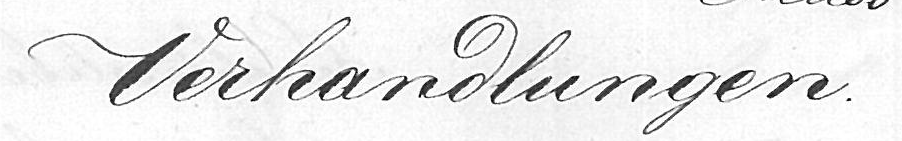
Verhandlungen.
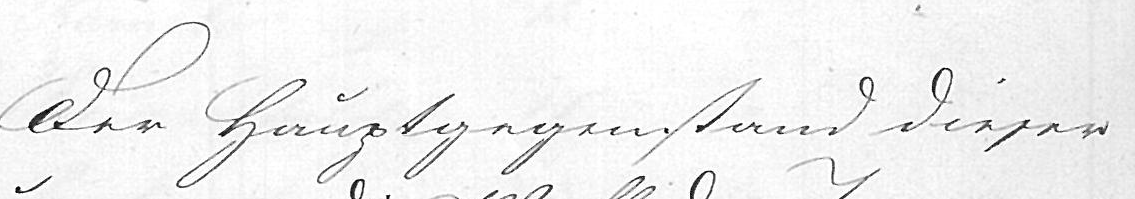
der Hauptgegenstand dieser
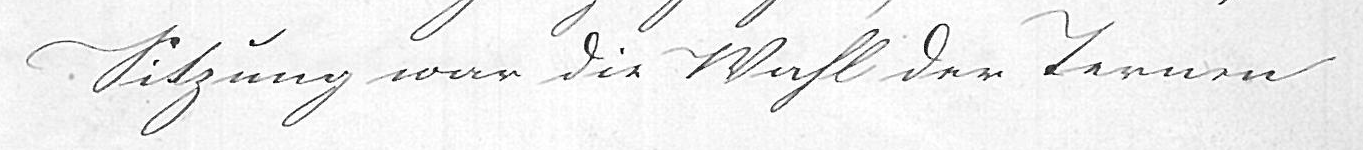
Sitzung war die Wahl der Ternen
